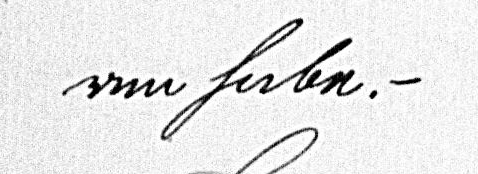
ren habe.-
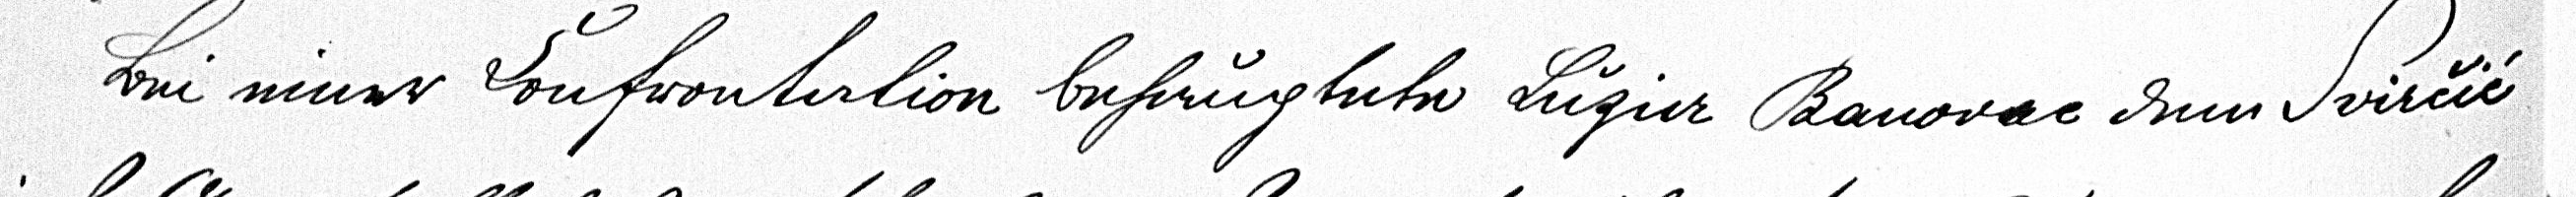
Bei einer Confrontation behauptete Luzia Banovac dem Svirčić
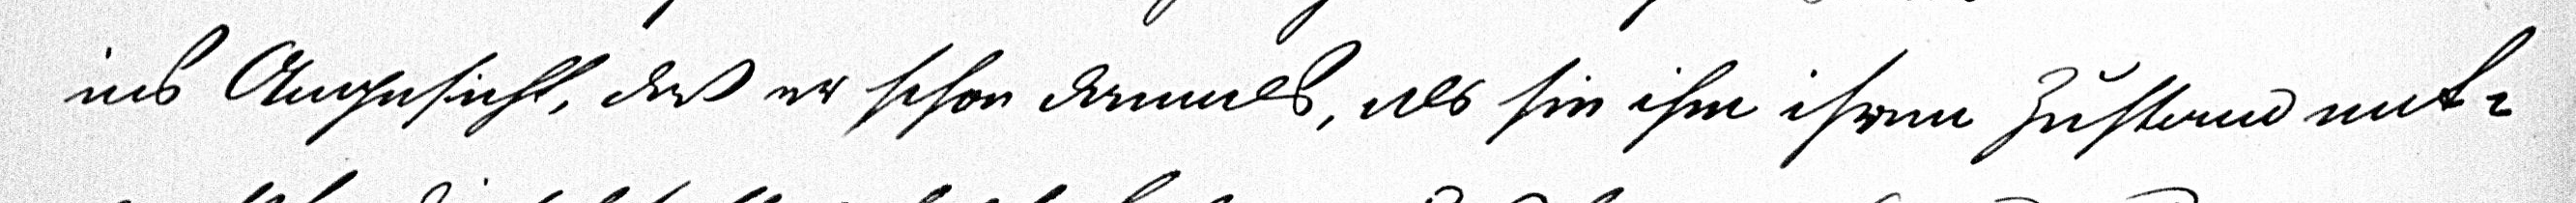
ins Angesicht, daß er schon damals, als sie ihm ihren Zustand ent¬
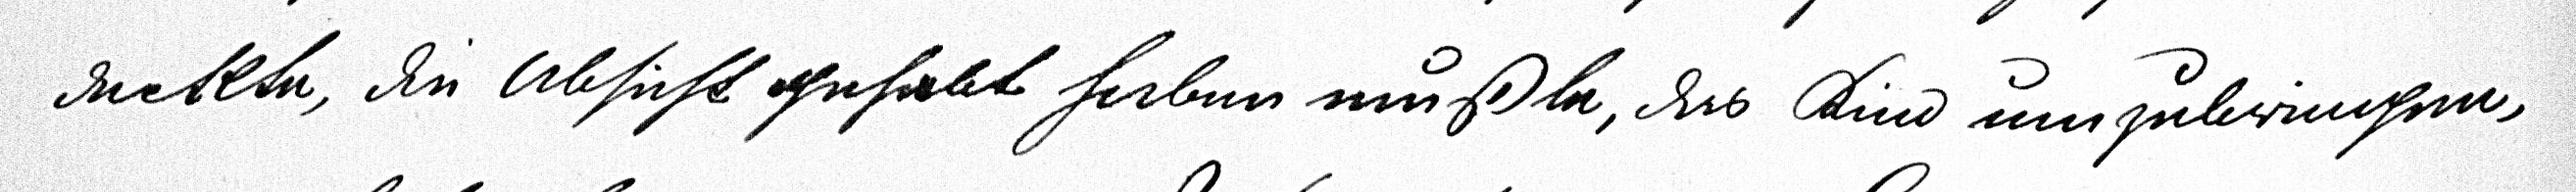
deckte, die Absicht gehabt haben mußte, das Kind umzubringen,
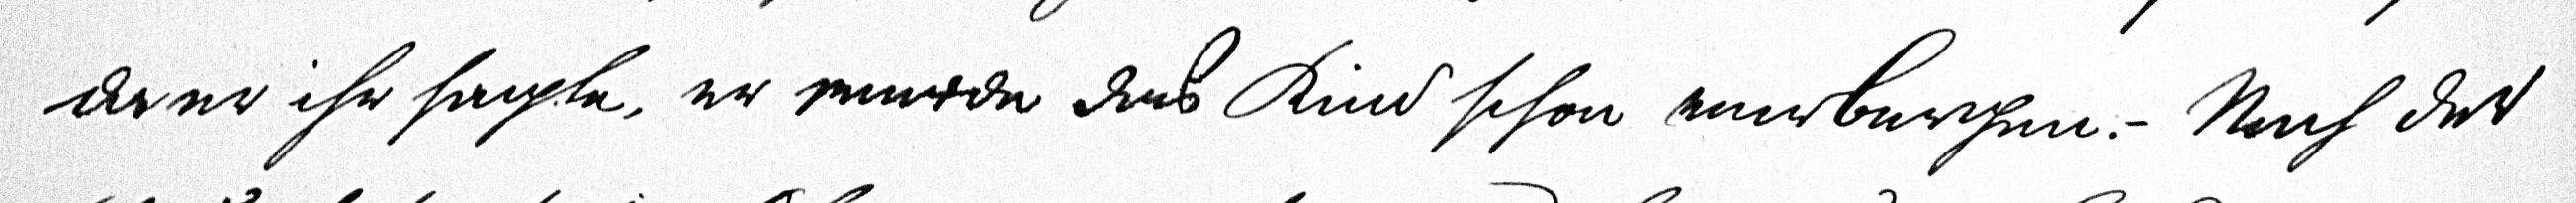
da er ihr sagte, er werde das Kind schon verbergen.- Nach der
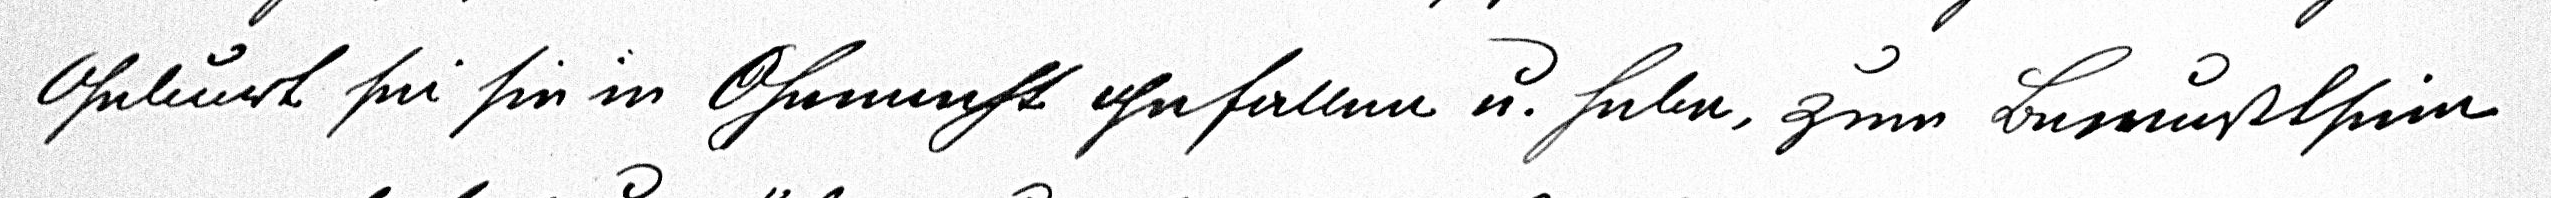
Geburt sie sie in Ohnmacht gefallen u. habe, zum Bewußtsein
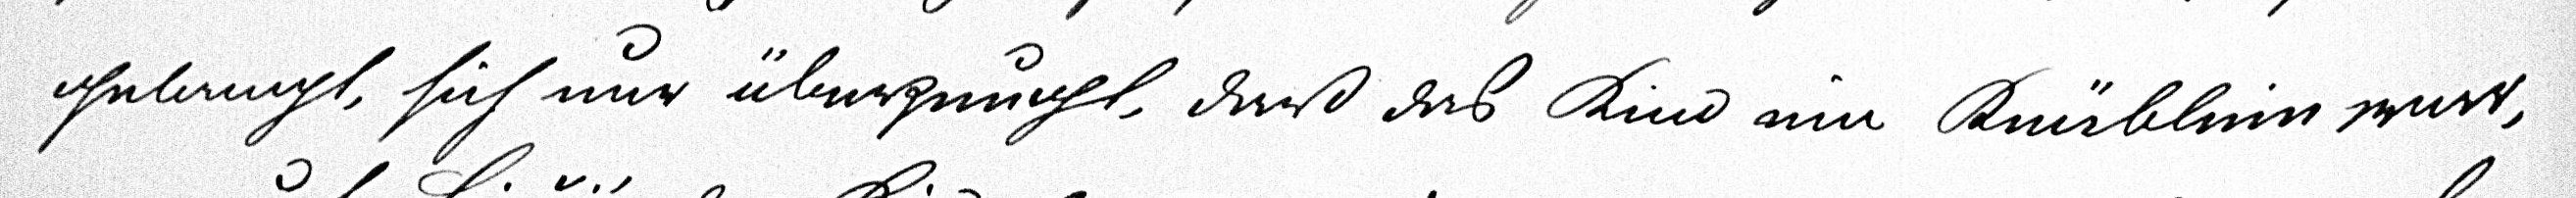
gelangt, sich nur überzeugt, daß das Kind ein Knäblein war,
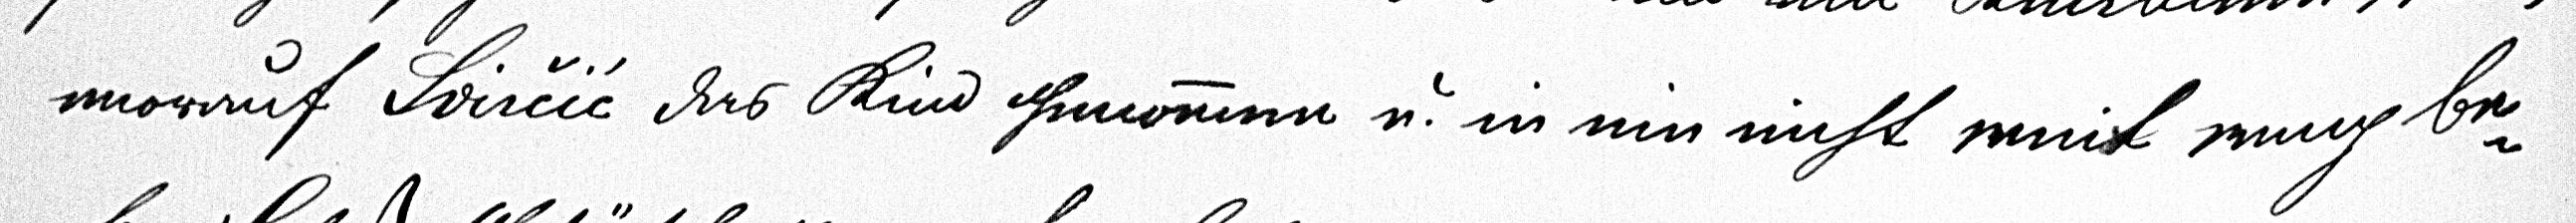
worauf Svirčić des Kind genommen u. in ein nicht weit weg be¬
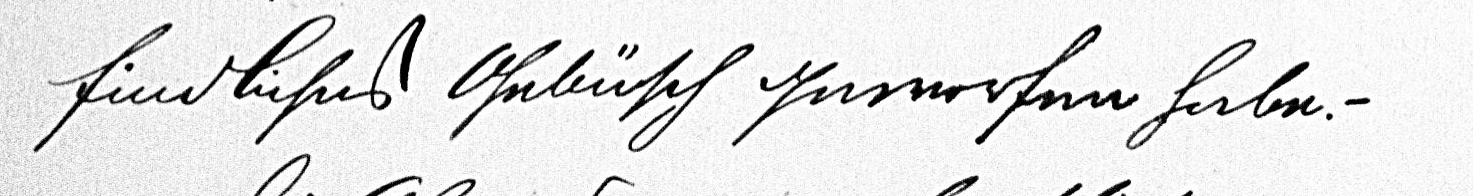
findliches Gebüsch geworfen habe.-
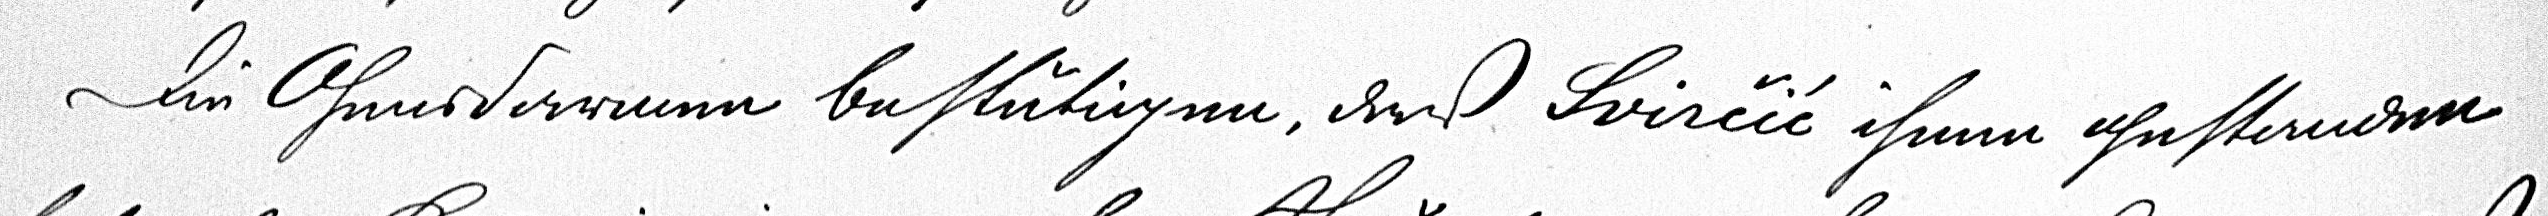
Die Gensdarmen bestätigen, daß Svirčić ihnen gestanden
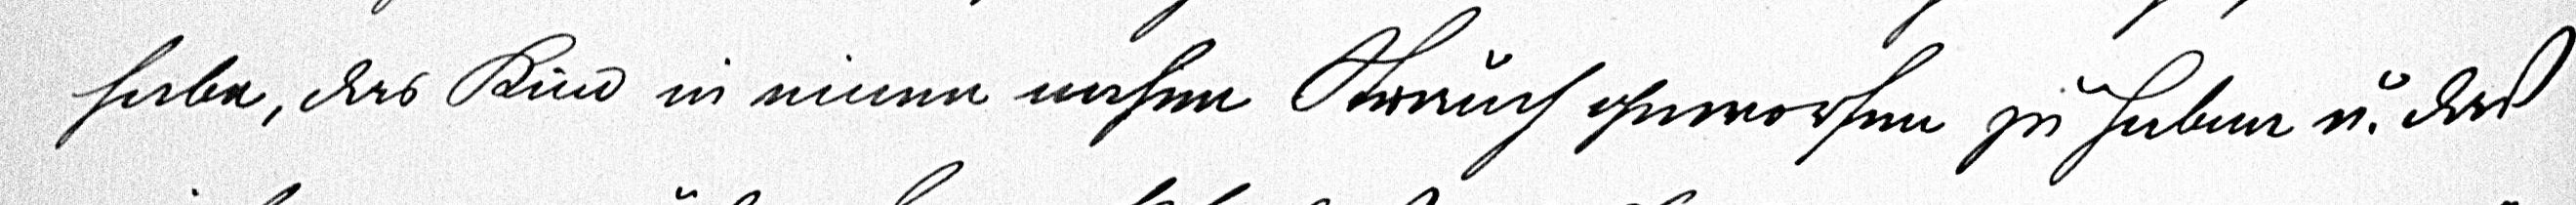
habe, das Kind in einen nahen Strauch geworfen zu haben u. daß
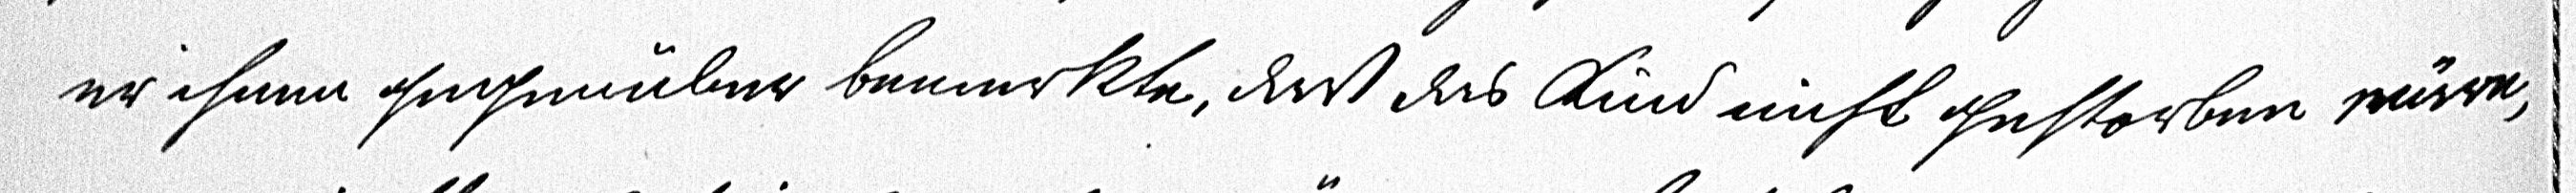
er ihnen gegenüber bemerkte, daß das Kind nicht gestorben wäre,
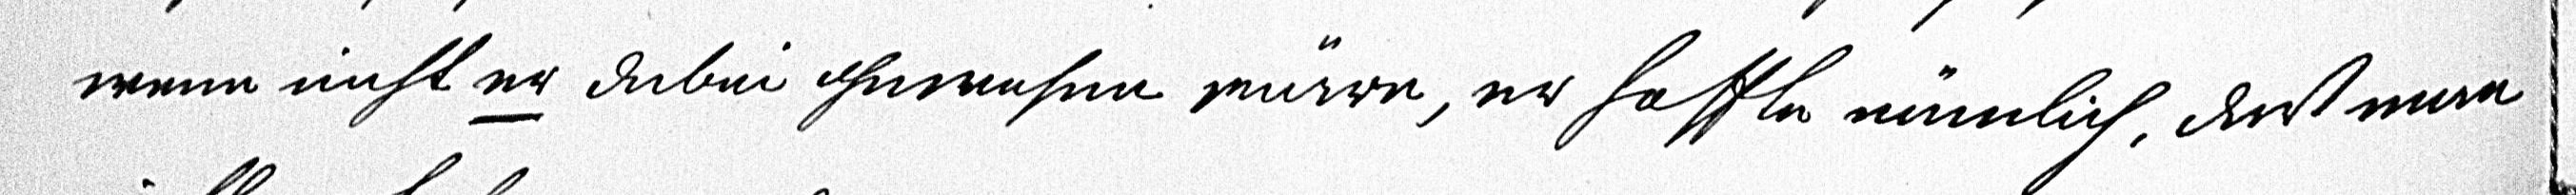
wenn nicht er dabei gewesen wäre, er haffte nämlich, daß man
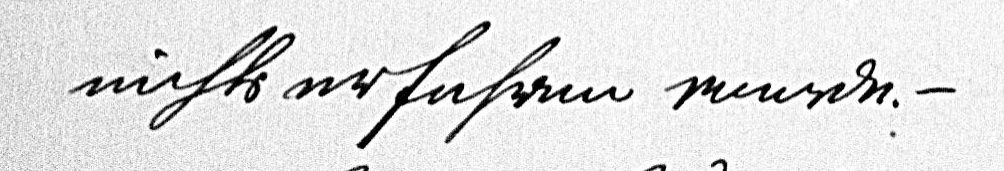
nichts erfahren werde.-
